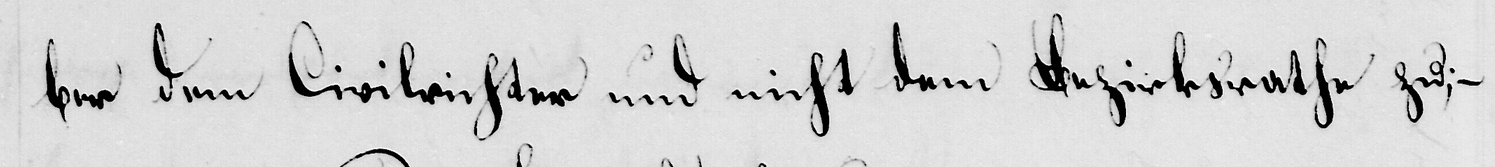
ber dem Civilrichter und nicht dem Bezirksrathe zu;
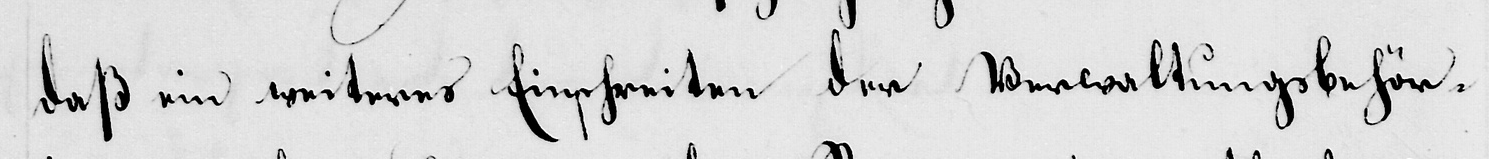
daß ein weiteres Einschreiten der Verwaltungsbehör¬
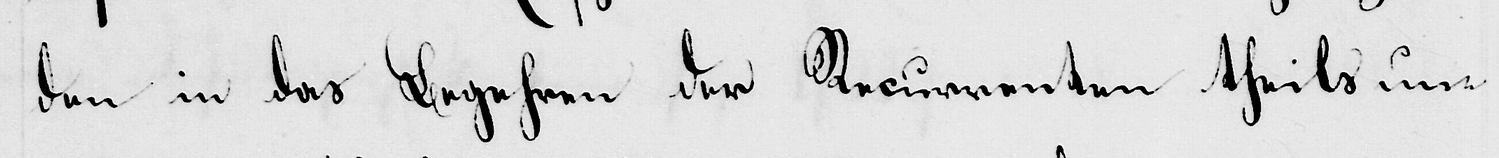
den in das Begehren der Recurrenten theils un¬
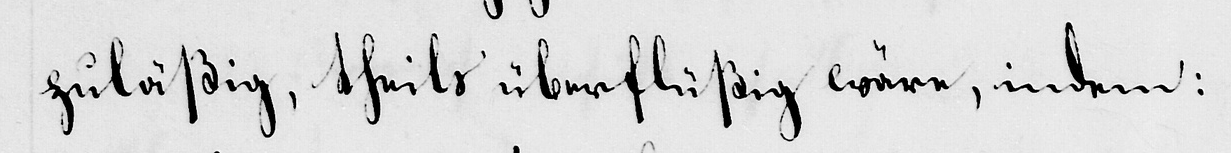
zuläßig, theils überflüßig wäre, indem:
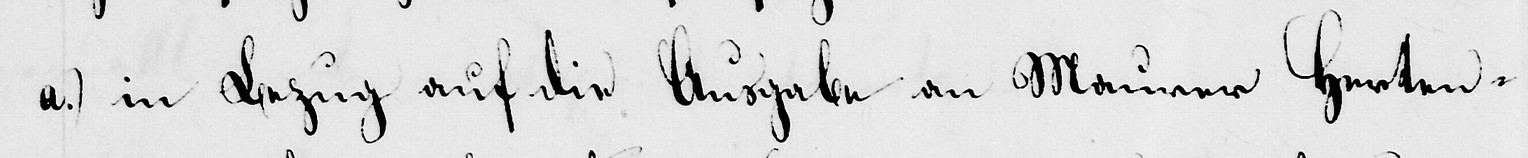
a.) in Bezug auf die Ausgabe an Maurer Herten¬
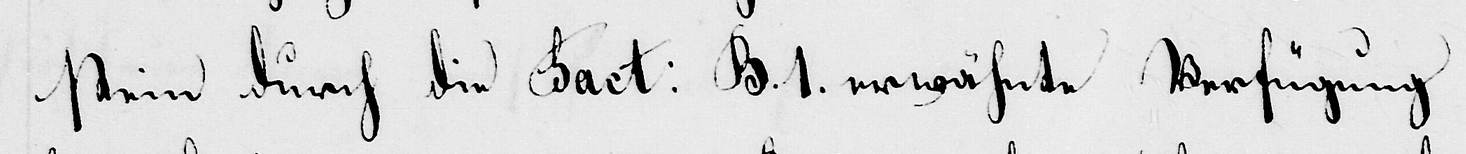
stein durch die Fact: B. 1. erwähnte Verfügung
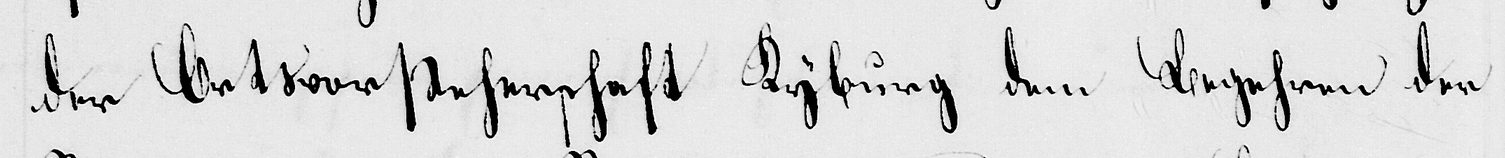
der Ortsvorsteherschaft Kyburg dem Begehren der
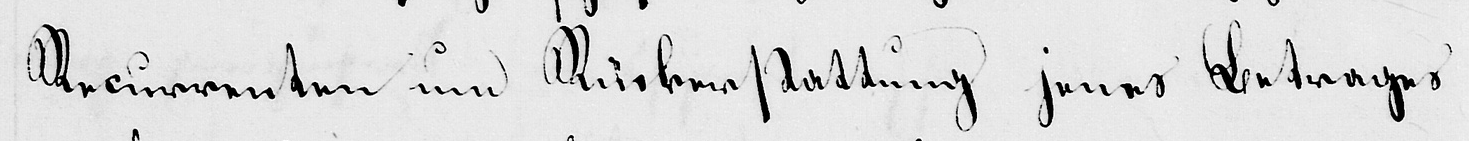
Recurrenten um Rückerstattung jenes Betrages
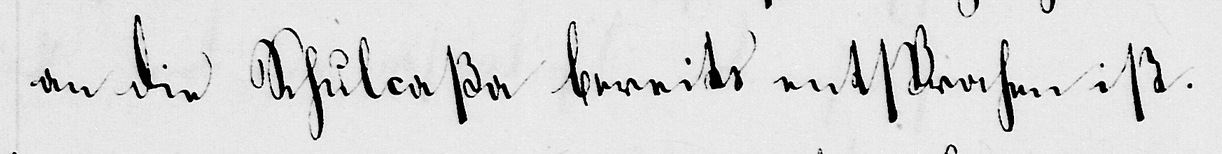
an die Schulcaßa bereits entsprochen ist.
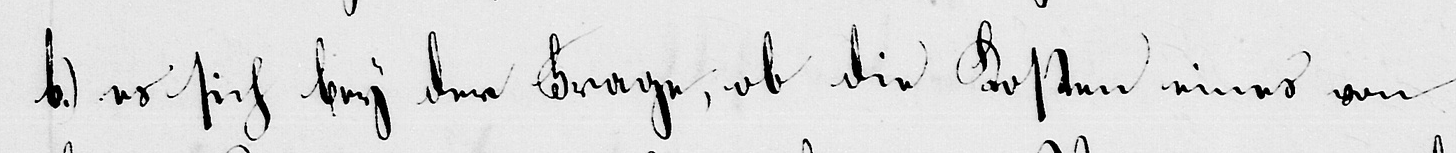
b.) es sich bey der Frage, ob die Kosten eines von
